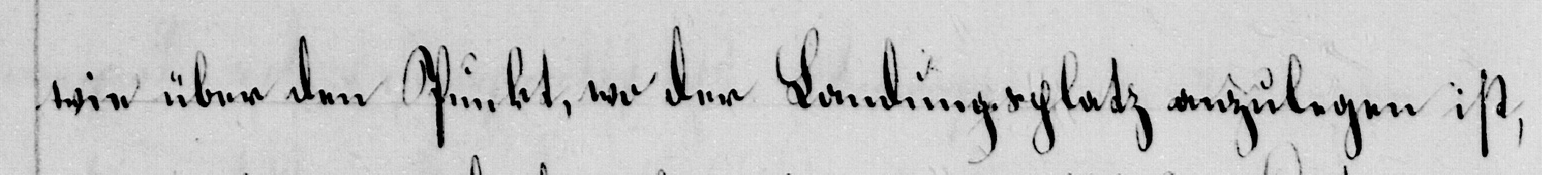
wie über den Punkt, wo der Landungsplatz anzulegen ist,
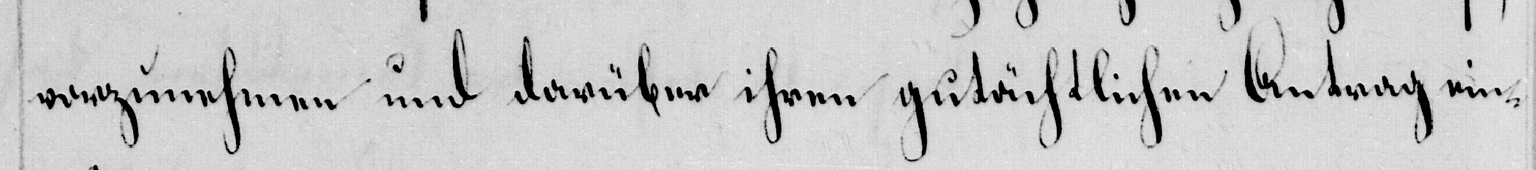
vorzunehmen und darüber ihren gutächtlichen Antrag ein¬
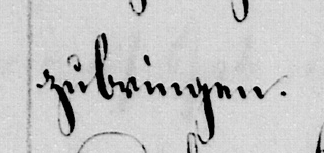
zubringen.
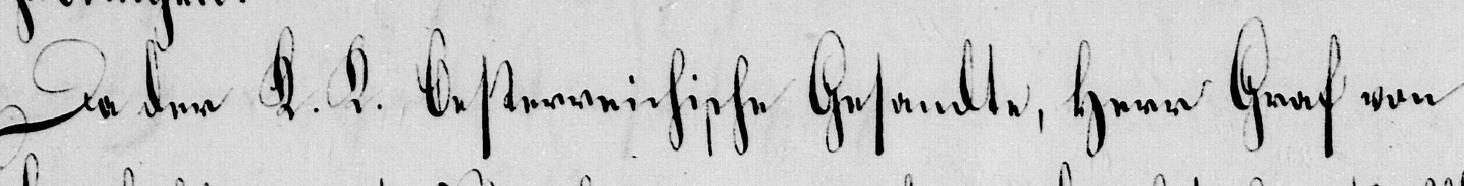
Da der K. K. Oesterreichische Gesandte, Herr Graf von
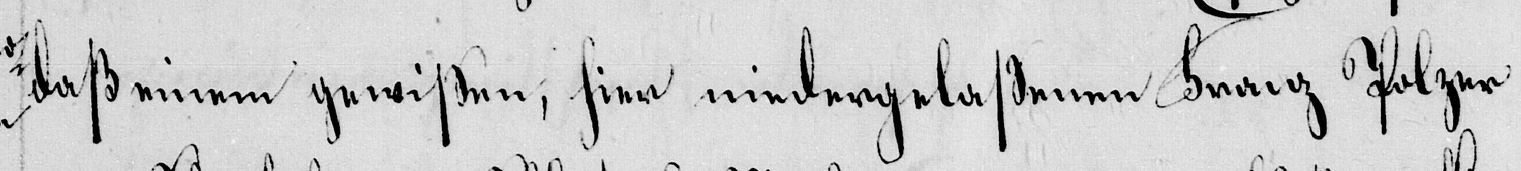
daß einem gewißen, hier niedergelaßenen Franz Polzer
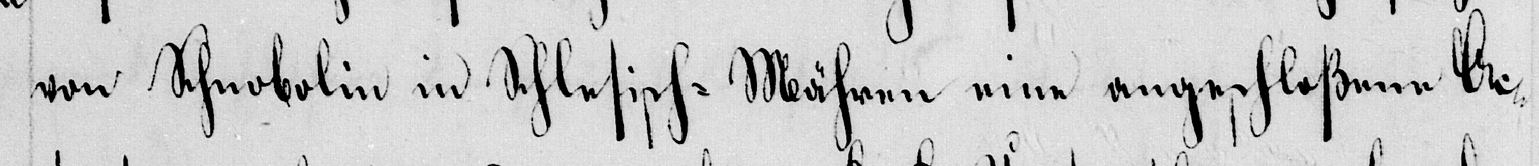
von Schnobolin in Schlesisch-Mähren eine angeschloßene A¬
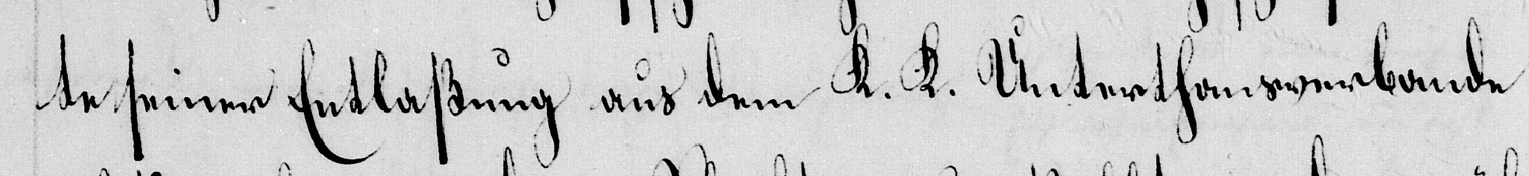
cte seiner Entlaßung aus dem K. K. Unterthansverbande
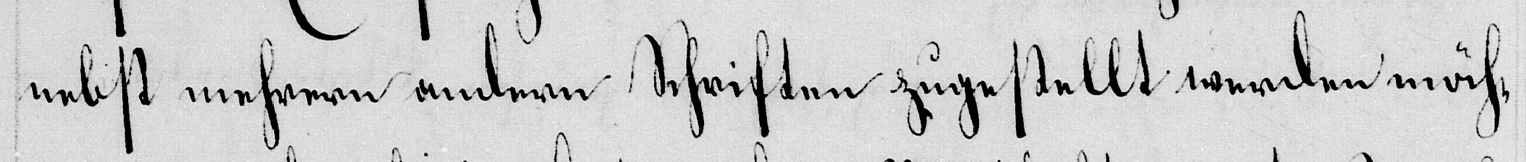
nebst mehrern andern Schriften zugestellt werden möch¬
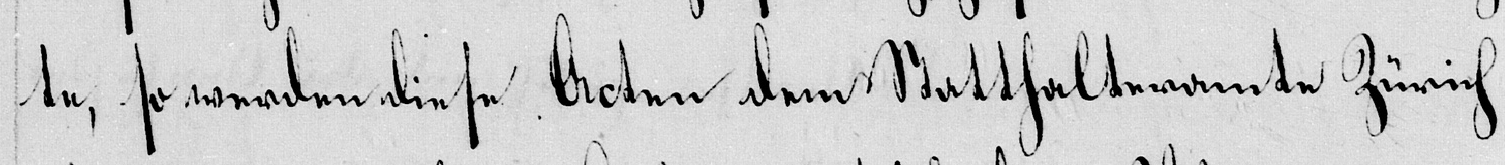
te, so werden diese Acten dem Statthalteramte Zürich
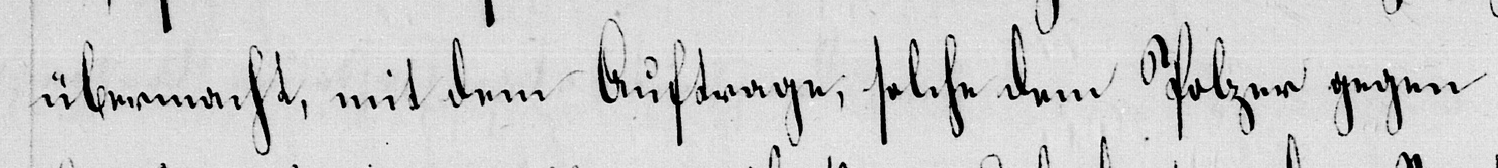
übermacht, mit dem Auftrage, solche dem Polzer gegen
